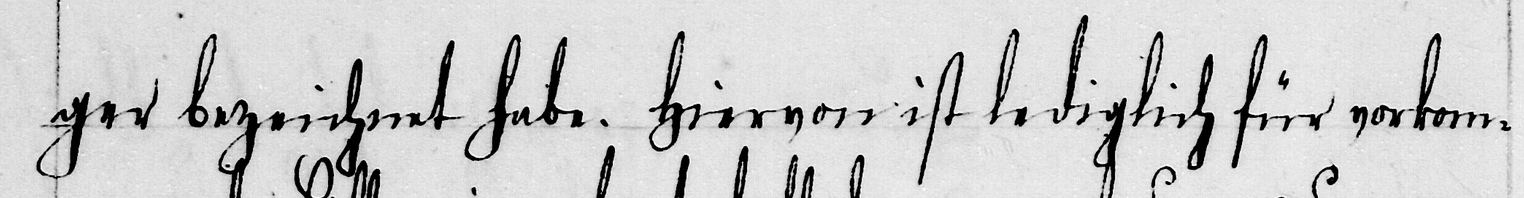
ger bezeichnet habe. Hiervon ist lediglich für vorkom¬
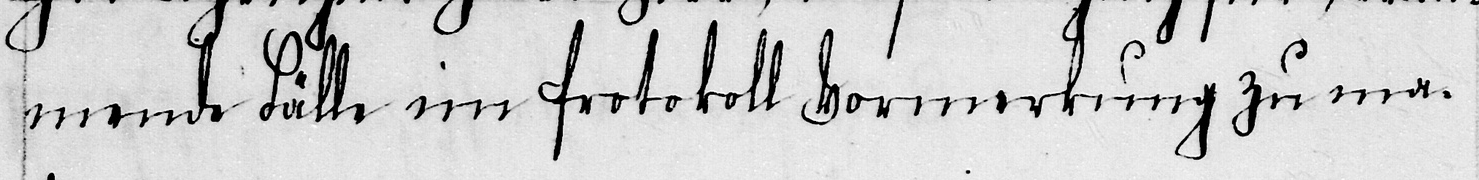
mende Fälle im Protokoll Vormerkung zu ma¬
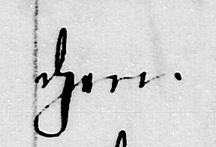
chen.
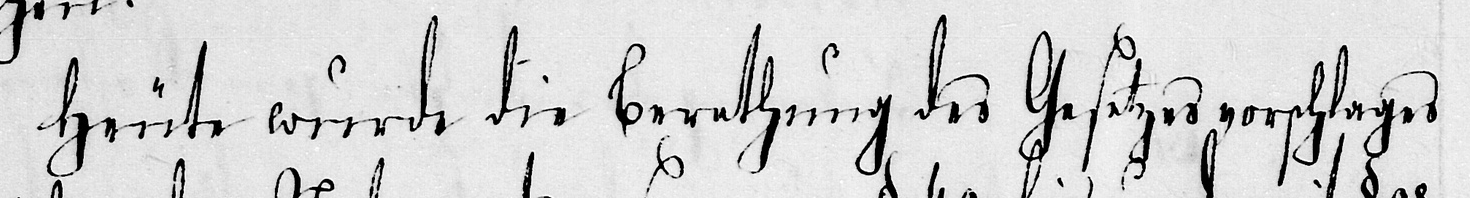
Heute wurde die Berathung des Gesetzesvorschla¬
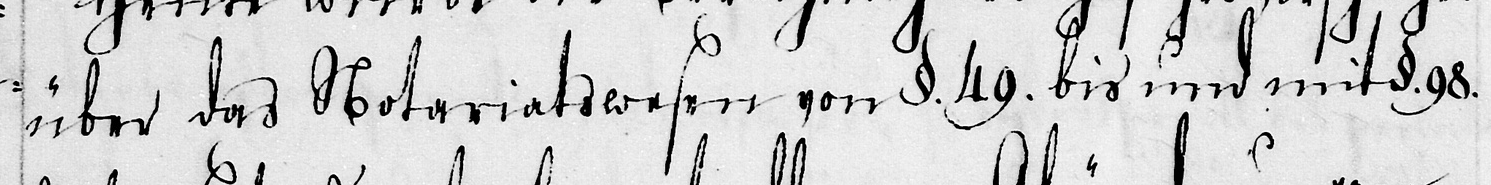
über das Notariatswesen von §. 49. bis und mit §. 98.
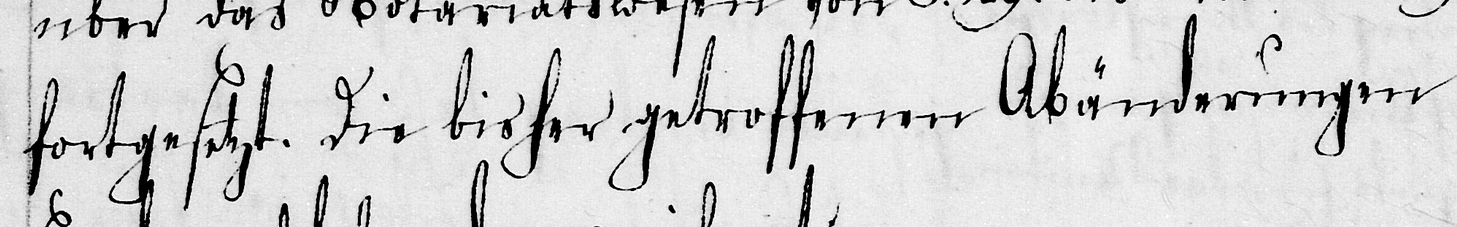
fortgesetzt. Die bisher getroffenen Abänderungen
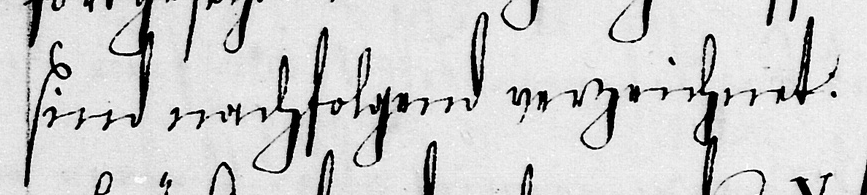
sind nachfolgend verzeichnet:
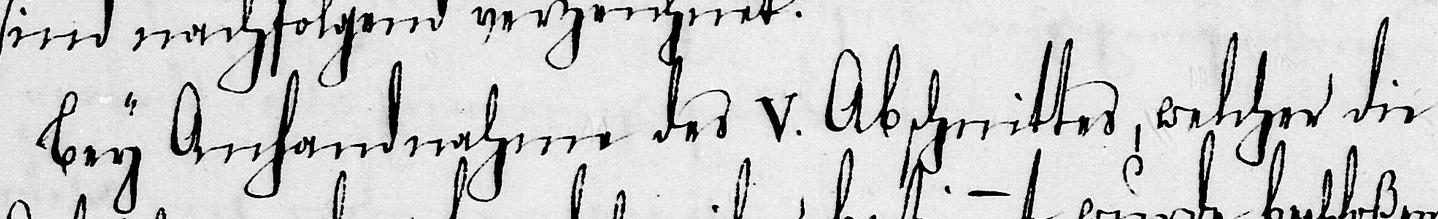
Bey Anhandnahme des V. Abschnittes, welcher die
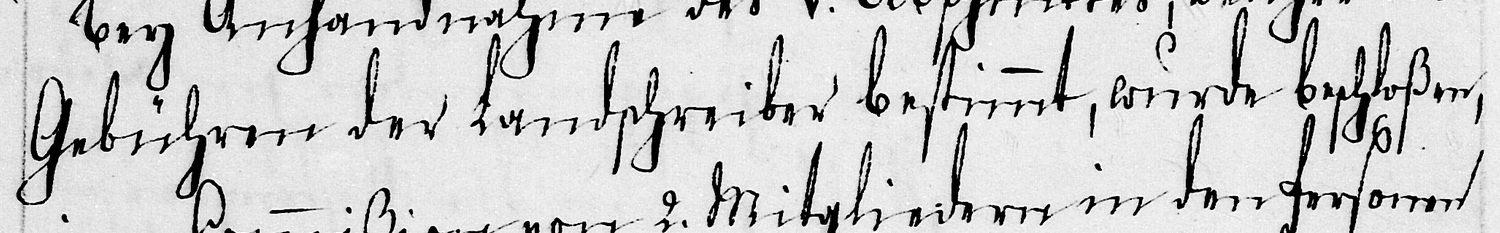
Gebühren der Landschreiber bestimmt, wurde beschloßen,
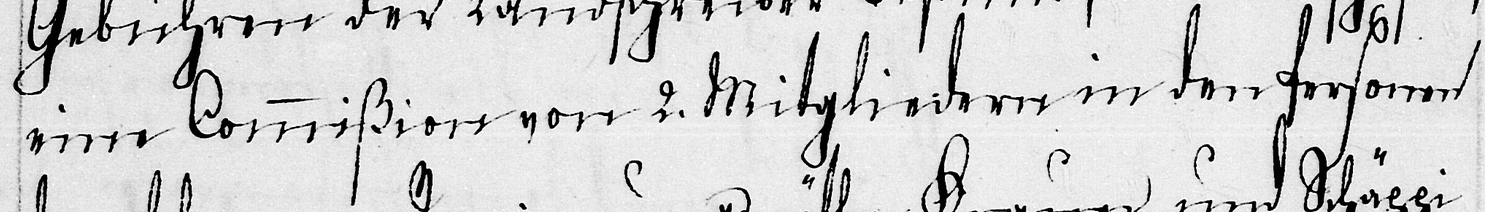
eine Commißion von 2. Mitgliedern in den Personen
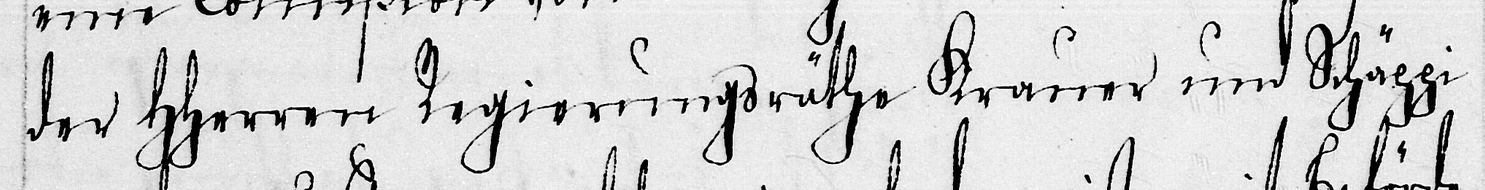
der HHerren Regierungsräthe Krauer und Schäppi
